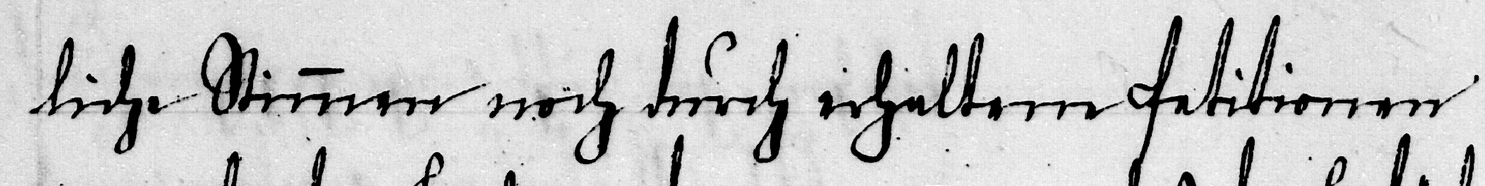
liche Stimmen noch durch erhaltene Petitionen
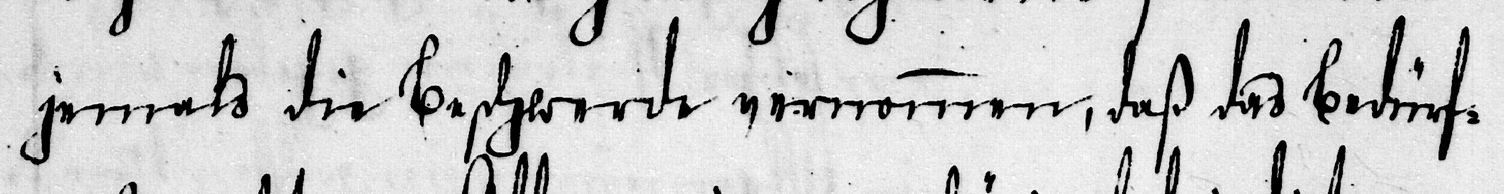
jemals die Beschwerde vernommen, daß das Bedürf¬
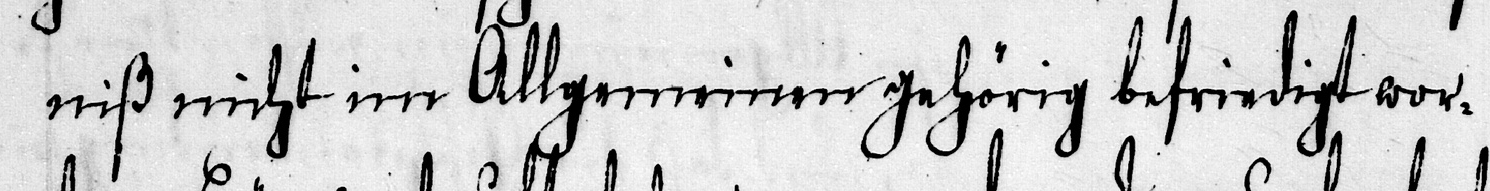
niß nicht im Allgemeinen gehörig befriedigt wor¬
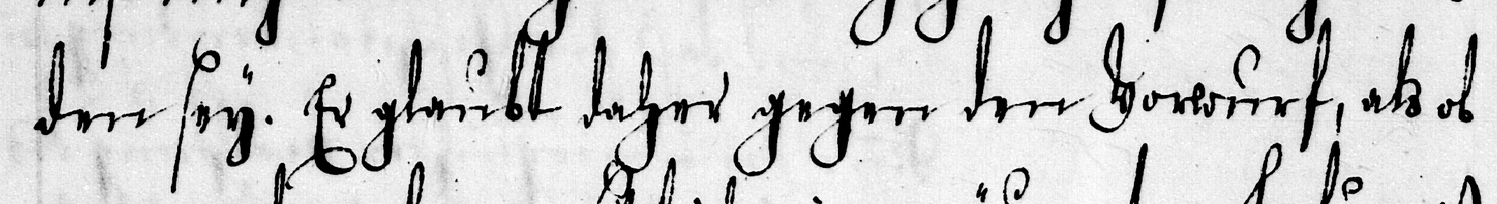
den sey. Er glaubt daher gegen den Vorwurf, als
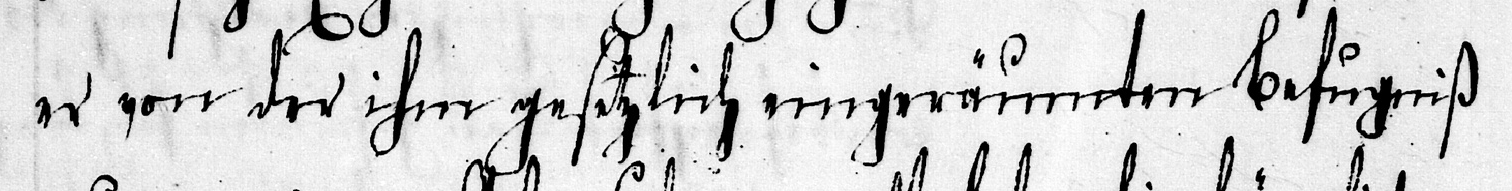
er von der ihm gesetzlich eingeräumten Befugniß
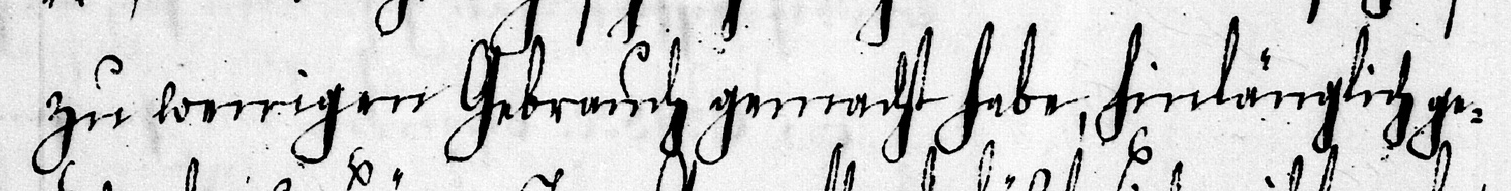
zu wenigen Gebrauch gemacht habe, hinlänglich g¬
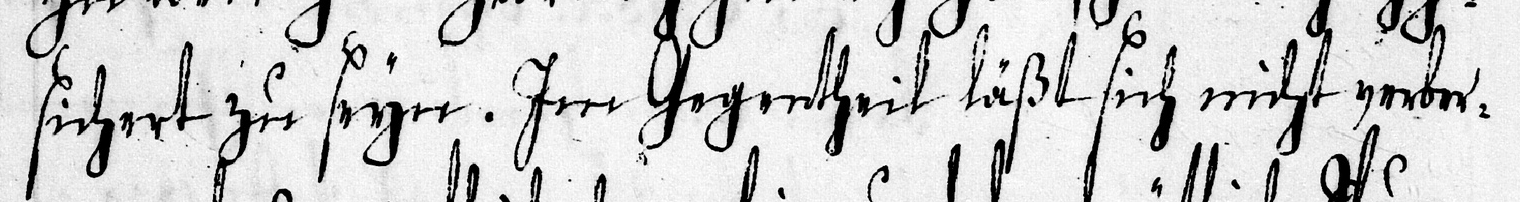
esichert zu seyn. Im Gegentheil läßt sich nicht verber¬
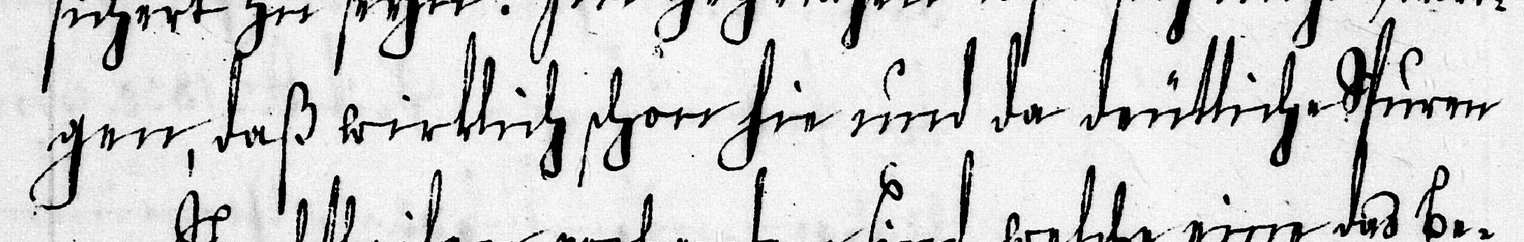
gen, daß wirklich schon hie und da deutliche Spuren
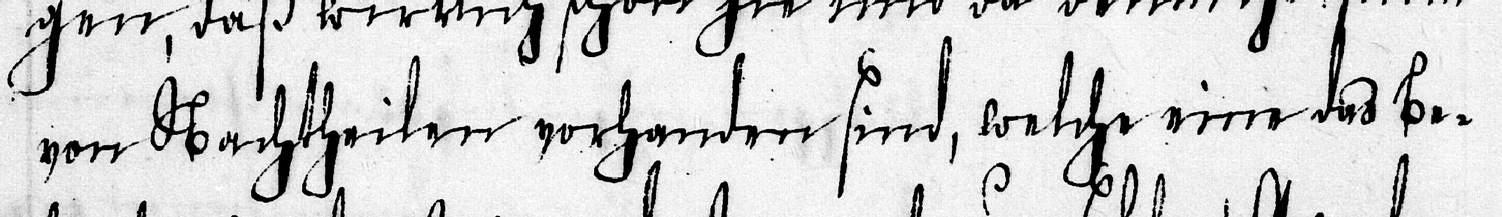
von Nachtheilen vorhanden sind, welche eine das Be¬
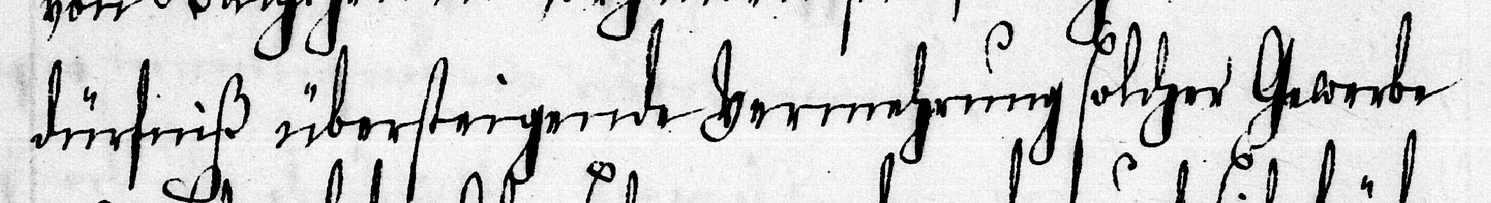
dürfniß übersteigende Vermehrung solcher Gewerbe
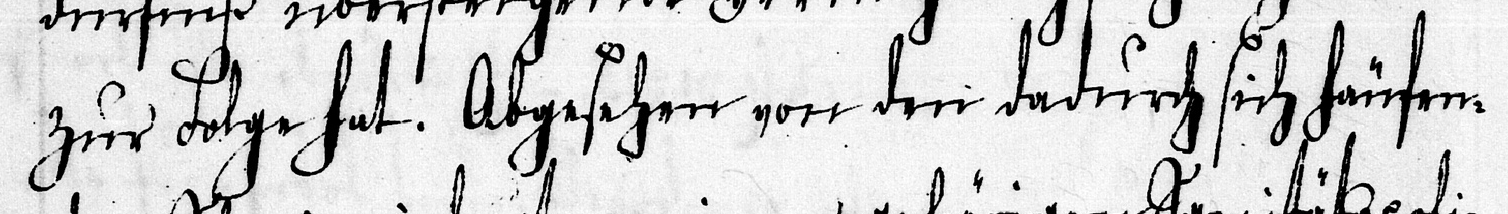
zur Folge hat. Abgesehen von den dadurch sich häufen¬
